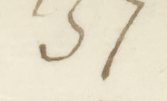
37
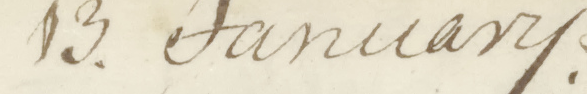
13. Januarii.
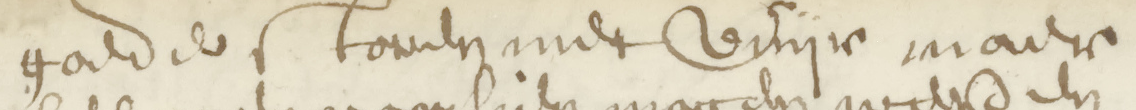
goede stoven met vuijr, naer
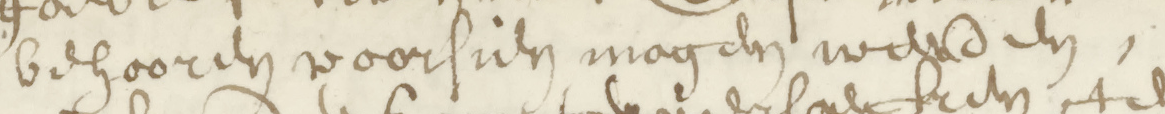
behooren voorsien mogen werden,
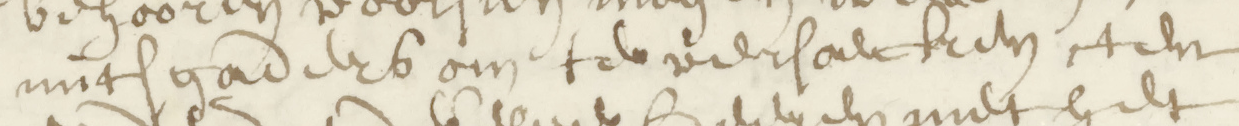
mitsgaders om te versoecken, ten
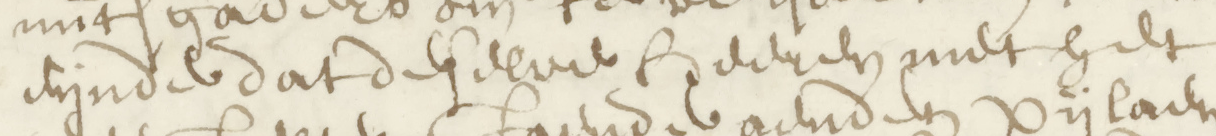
eijnde dat deselve Heeren met het
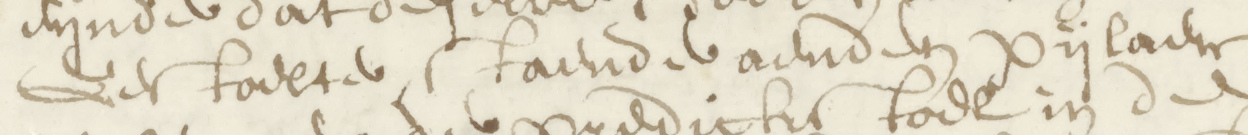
Gestoelte staende aenden pijlaer
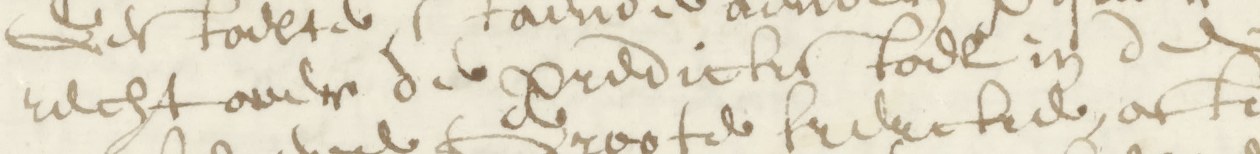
recht over de predickstoel in de
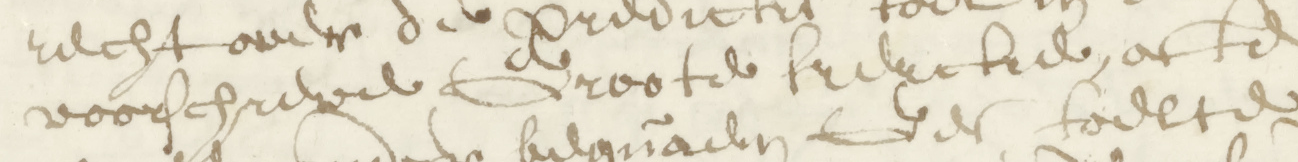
voorschreve Groote Kercke, ofte
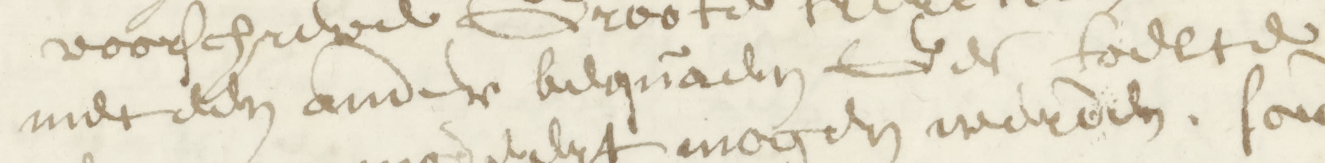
met een ander bequaem Gestoelte
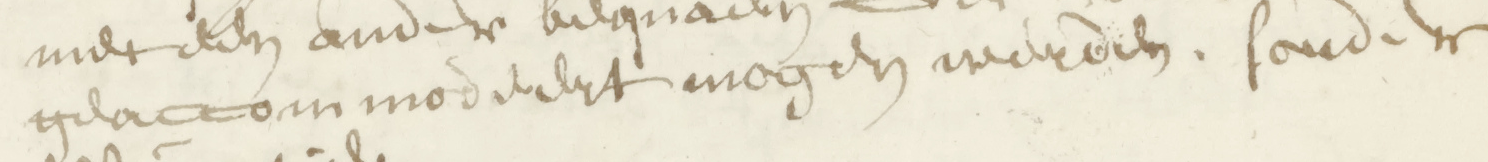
geaccommodeert mogen werden, sonder
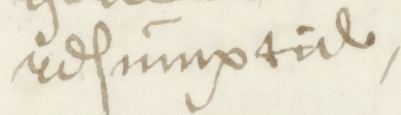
resumptie
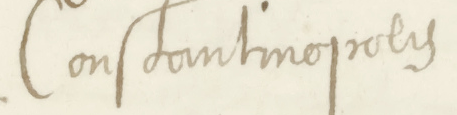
Constantinopolis
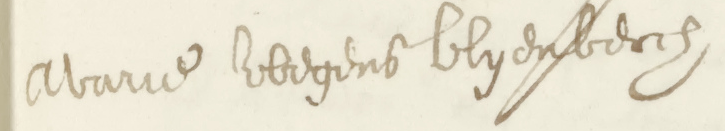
avarie wegens blyenberch,
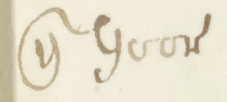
& Goor
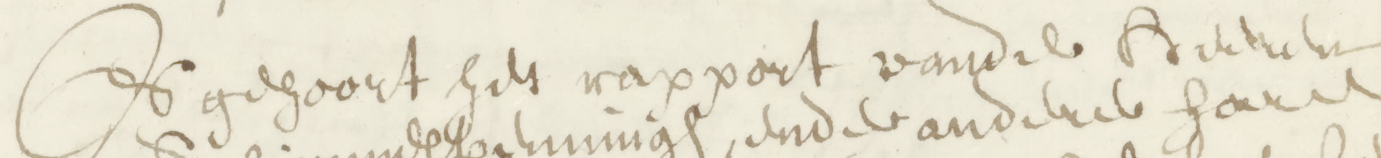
Is gehoort het rapport vande Heeren
